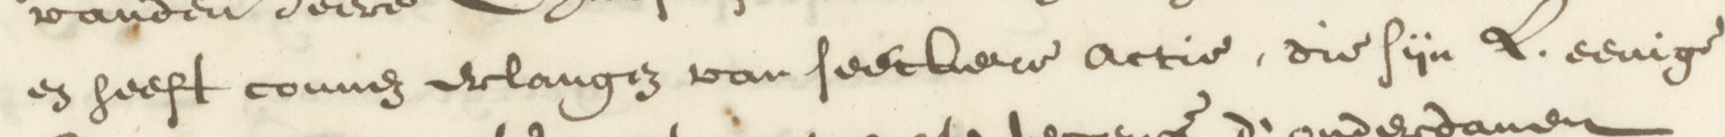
en heeft connen erlangen van seeckere actie, die sijn L. eenige
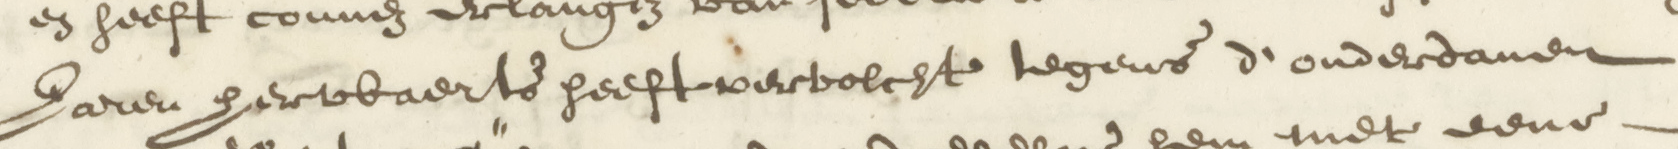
Jaren herwaerts heeft vervolcht tegens d‛onderdanen
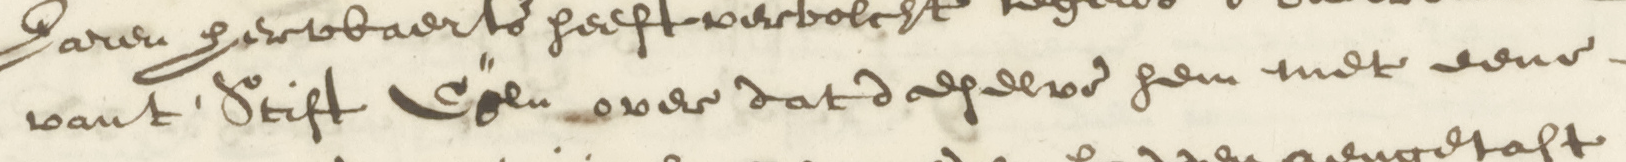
vant' Stift Cöln over dat deselve hem met eene
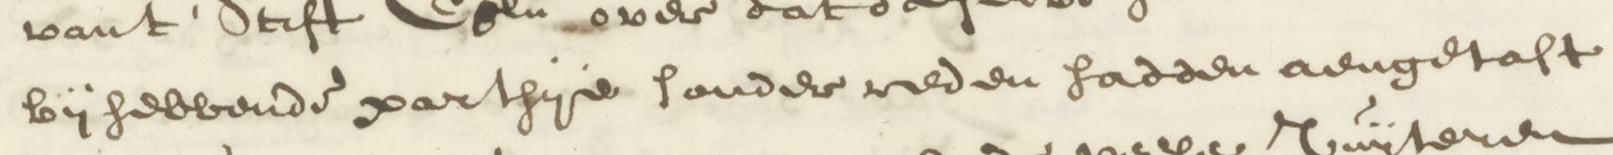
bijhebbende parthije sonder reden hadden aengetast
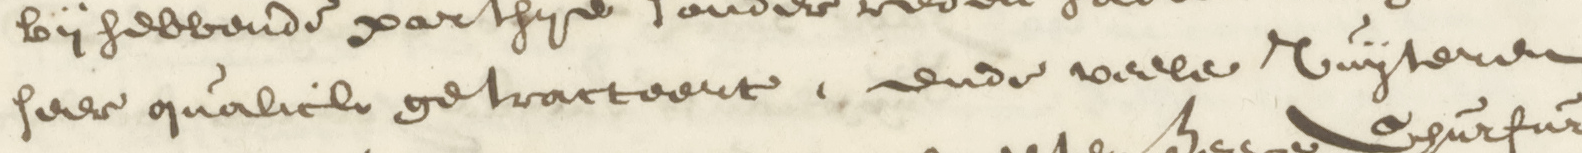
seer qualick getracteert, ende veele Ruijteren
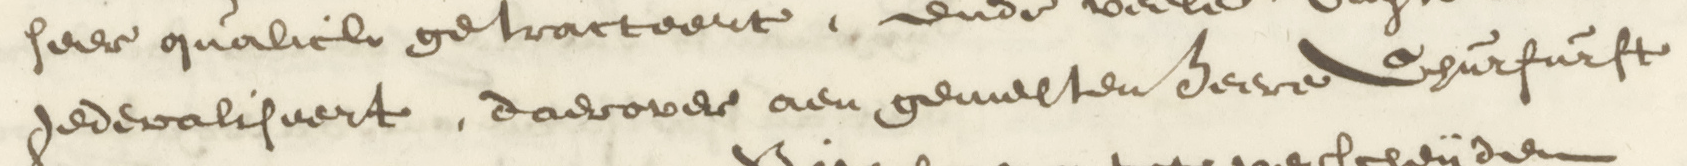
gedevaliseert, daerover aen gemelten Heere Churfurst
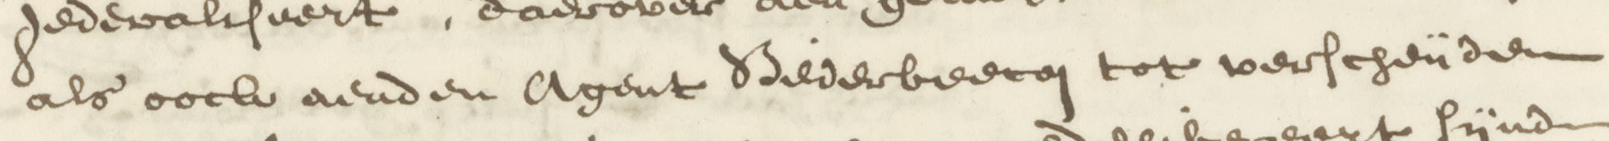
als oock aenden Agent Bilderbeecq tot verscheijden
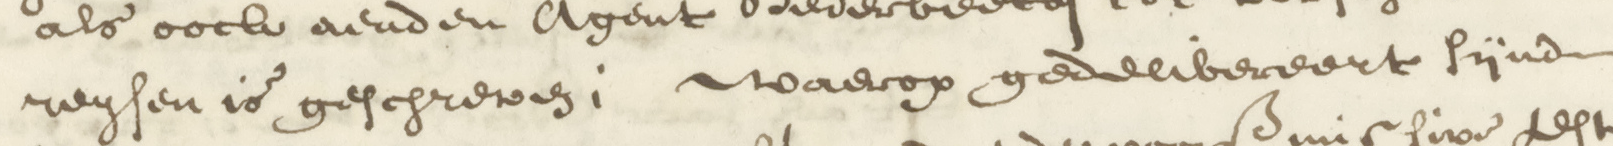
reysen is geschreven: waerop gedelibereert sijnde
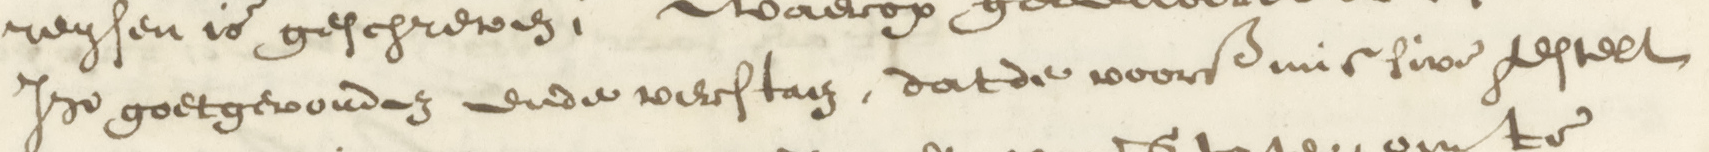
Is goetgevonden ende verstaen, dat de voors missive gestelt
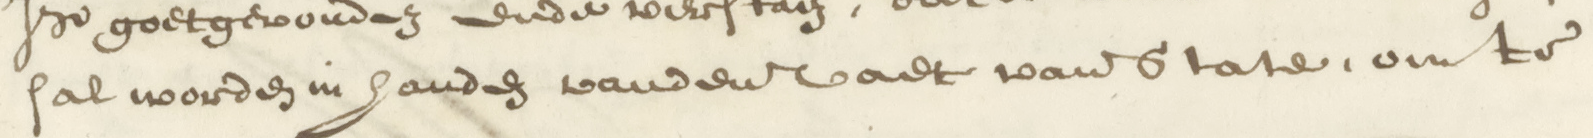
sal worden in handen vanden raet van State, om te
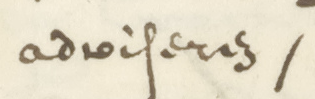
adviseren.
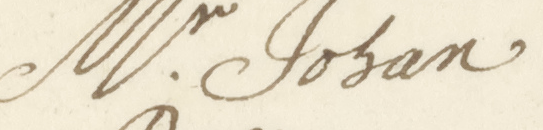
Mr. Johan
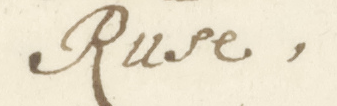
Ruse,
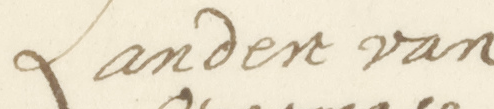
Landen van
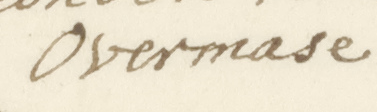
Overmase
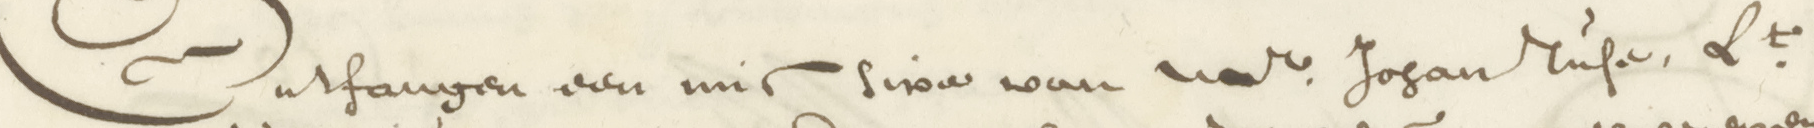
Ontfangen een missive van Mr. Johan Ruse, Lt.
